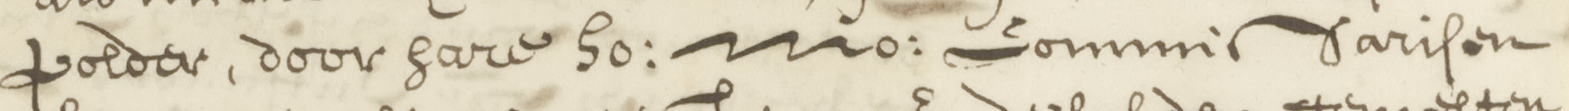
polder, door hare ho:Mo Commissarisen
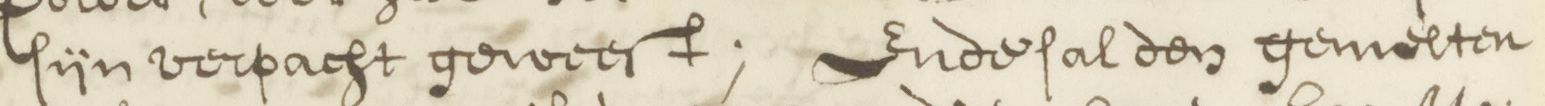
sijn verpacht geweest; Ende sal den gemelten
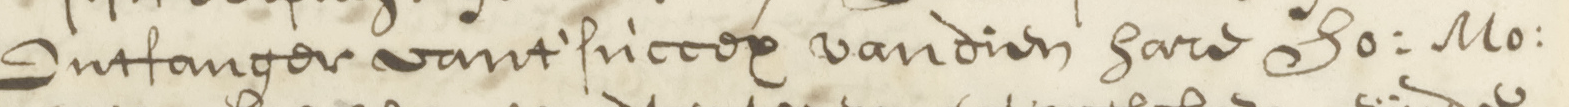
Ontfanger vant' succex vandien hare Ho:Mo:
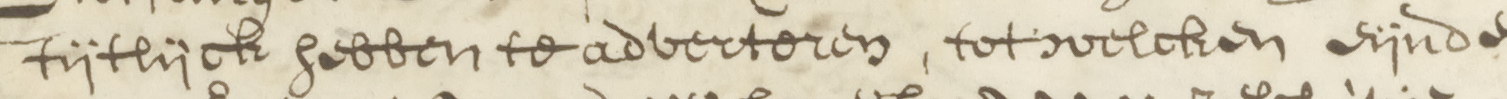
tijtlijck hebben te adverteren, tot welcken eijnde
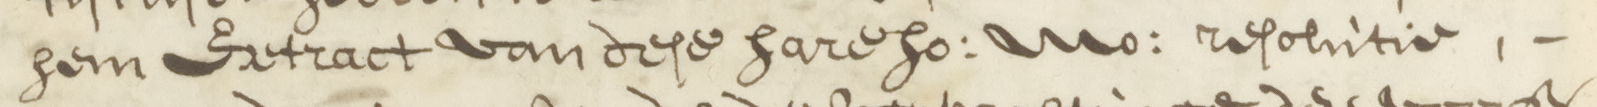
hem Extract van dese hare ho:Mo: resolutie , -
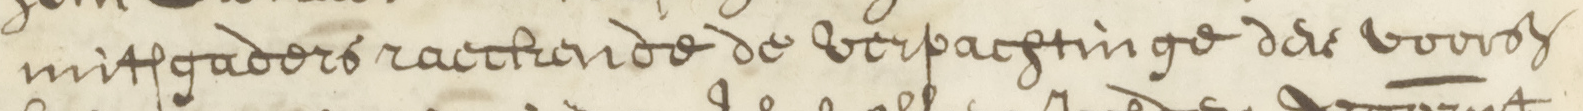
mitsgaders raeckende de verpachtinge der voorz
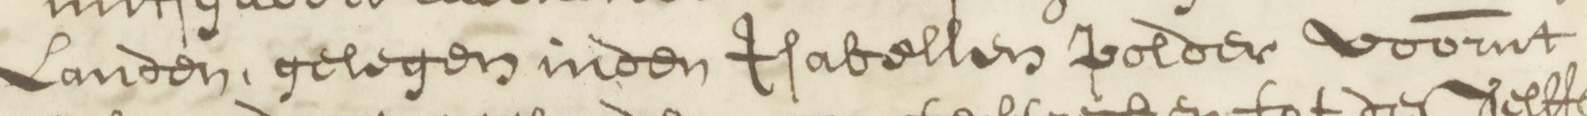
Landen, gelegen inden Isabellen Polder voornt
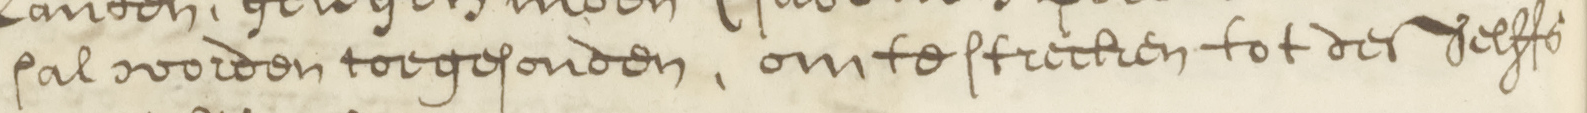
sal worden toegesonden, om te strecken tot derselffs
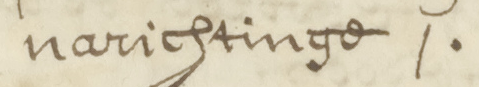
narichtinge.
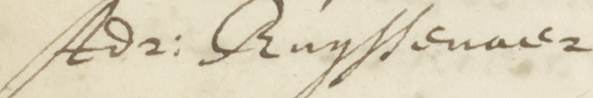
Adr: Ruyssenaer
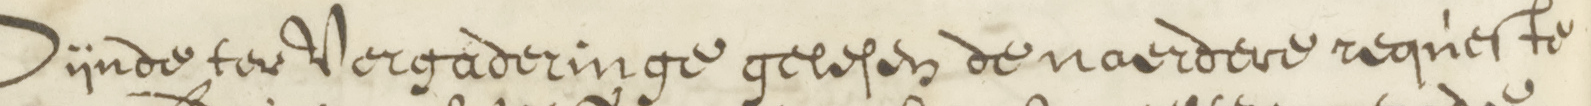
Sijnde ter Vergaderinge gelesen de naerdere requeste
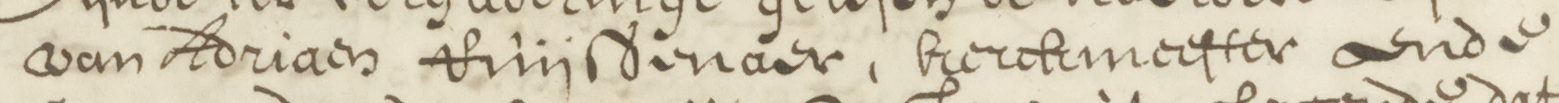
van Adriaen Ruijssenaer, kerckmeester ende
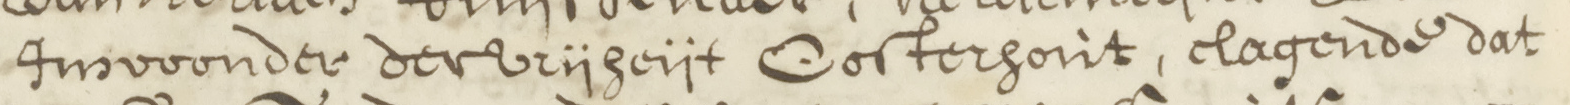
Inwoonder der vrijheijt Oosterhout, clagende dat
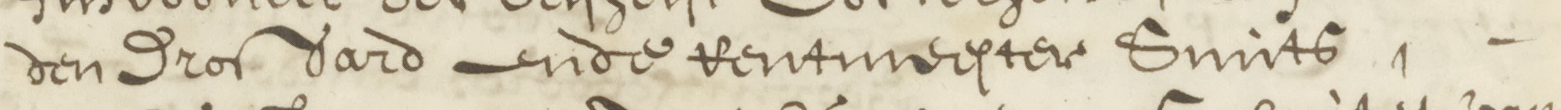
den Drossard ende Rentmeester Smits , -
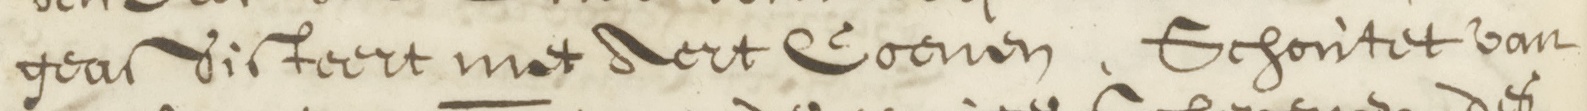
geassisteert met Aert Coenen, Schoutet van
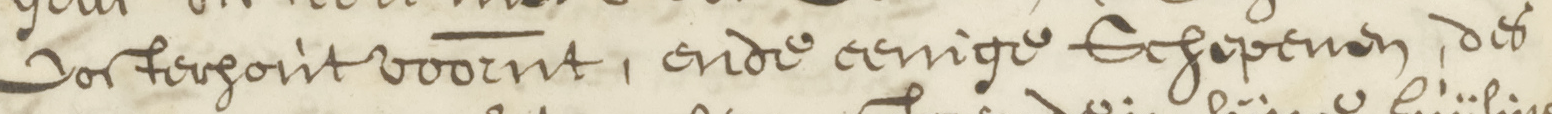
Oosterhout voornt, ende eenige Schepenen, des
